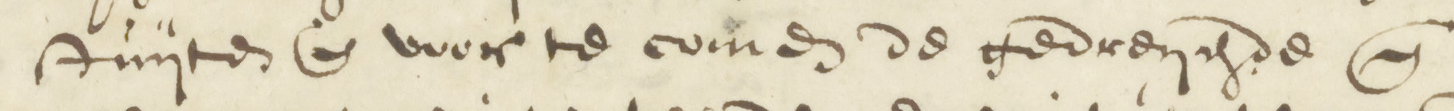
stuijten & voort te comen de gedreygde &
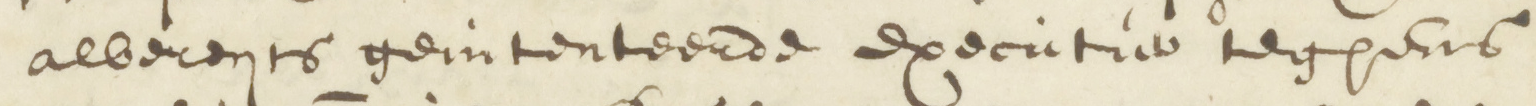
albereijts geintenteerde executie teghens
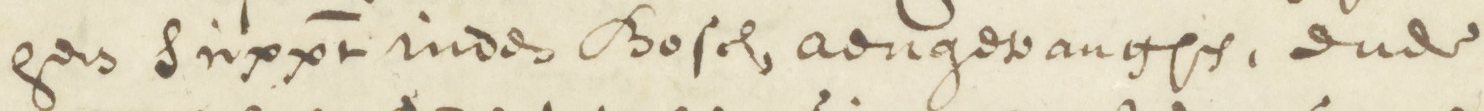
hem supplt inden Bosch aengevanghen, ende
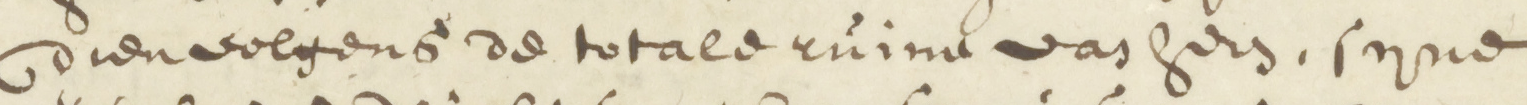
dienvolgens de totale ruine van hem, syne
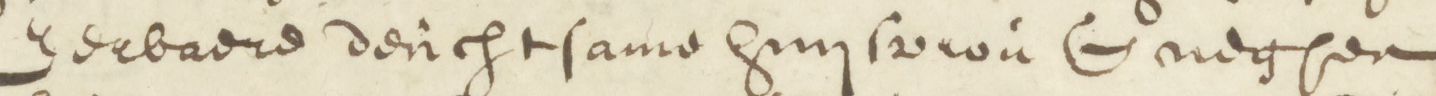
Eerbaere deuchtsame huysvrou & neghen
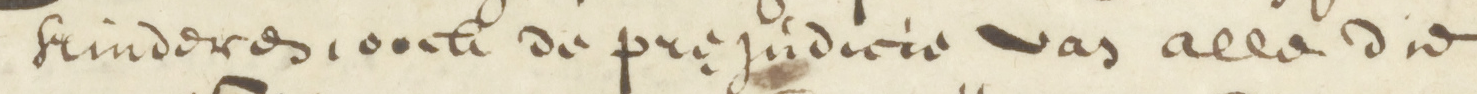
kinderen, oock de prejudicie van alle die
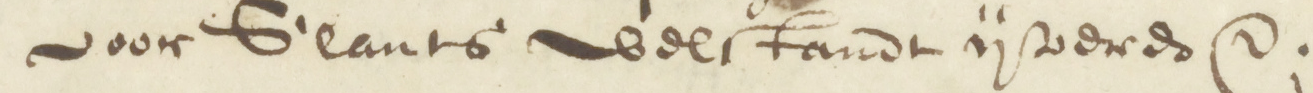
voor S'lants welstandt ijveren &.
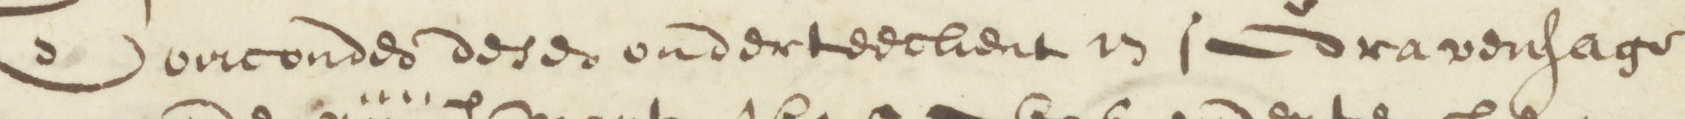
Ooirconden desen onderteeckent in s Gravenhage
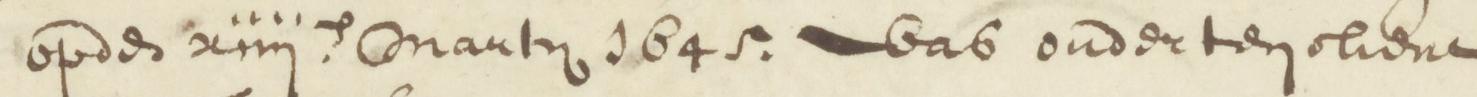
opden xiiiie Martij 1645. Was onderteyckent
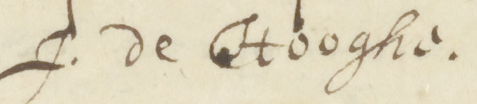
J. de Hooghe.
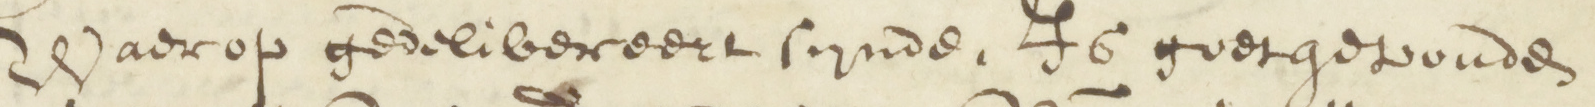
Waerop gedelibereert sijnde, Is goetgevonden
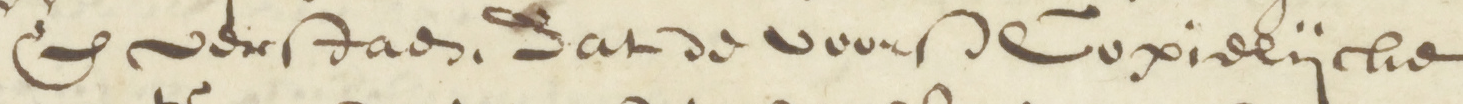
& verstaen dat de voors. Copielijcke
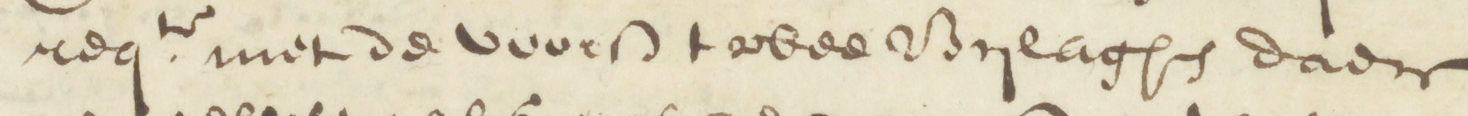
reqte. met de voors. twee Bijlaghen daer
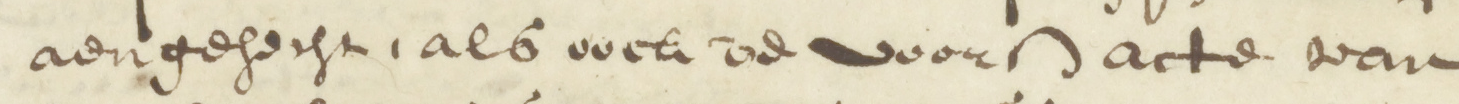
aen gehecht, als oock de voors. acte van
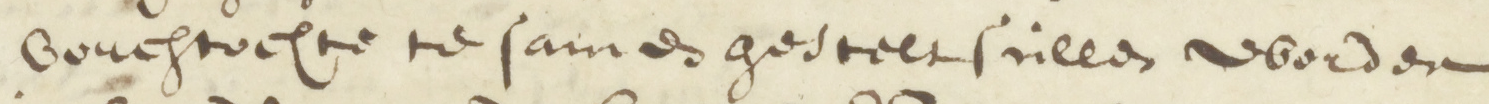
borchtochte te samen gestelt sullen worden
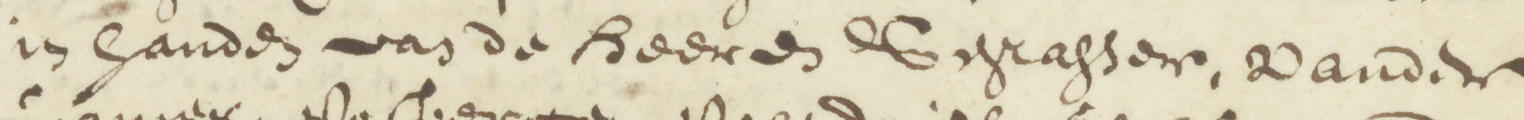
in handen van de heeren Schrasser, van der
